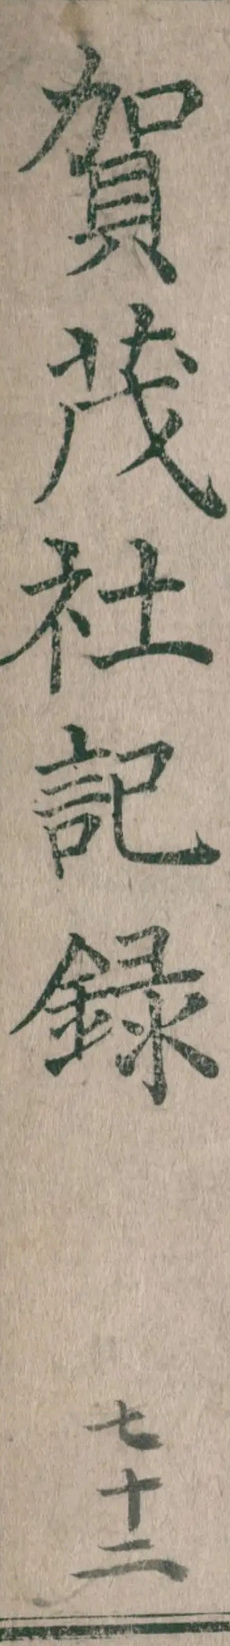賀茂社記録七十二

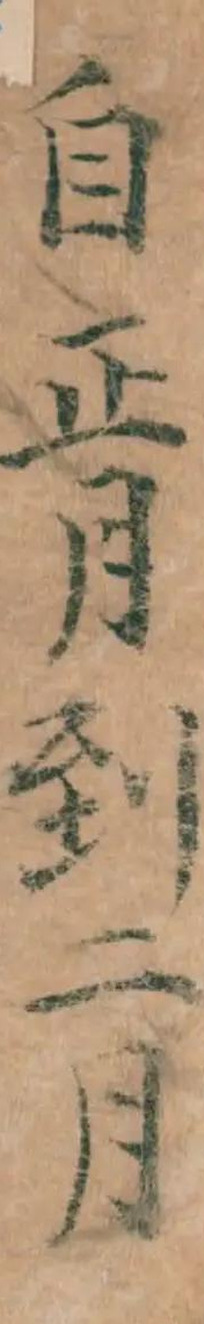自正月至二月
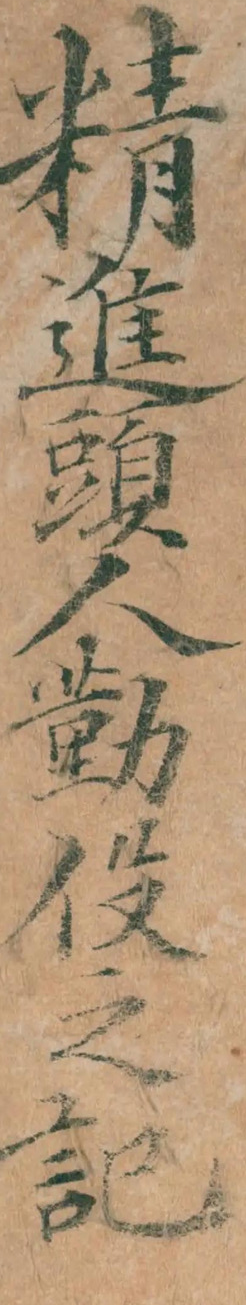精進頭人勤役之記天
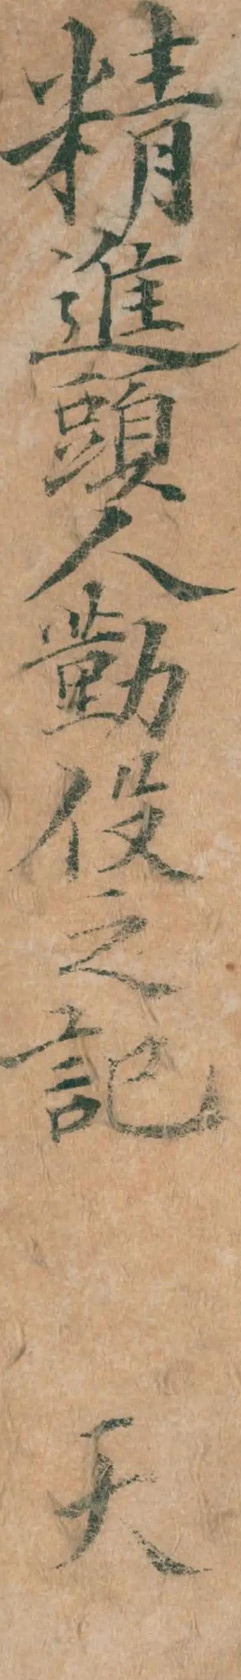精進頭人勤役之記天

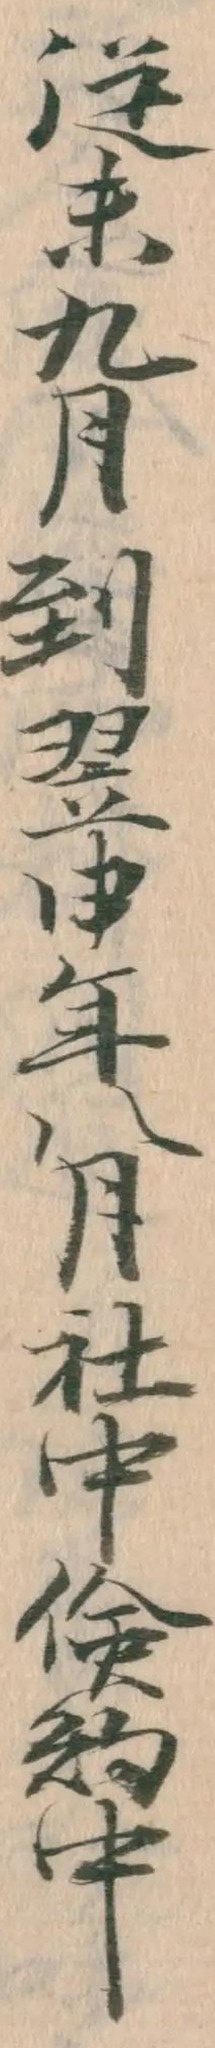従未九月到翌申年八月社中倹約中
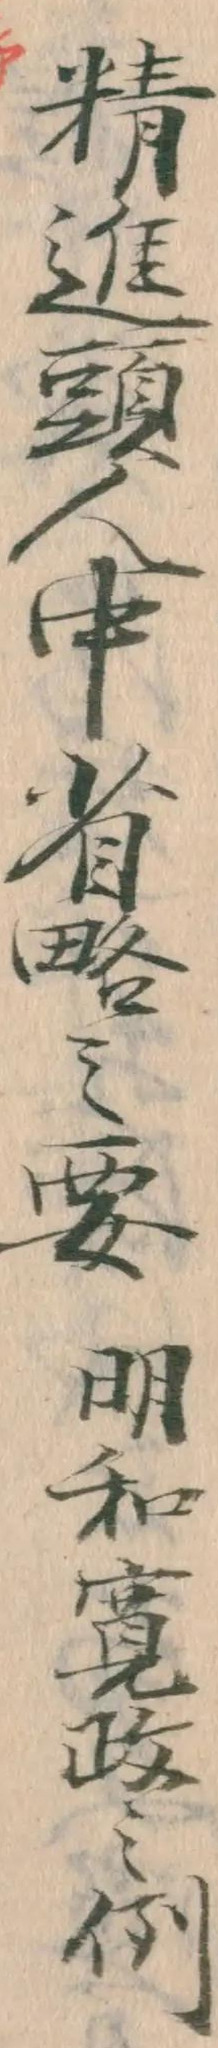精進頭人中省略之要明和寛政之例
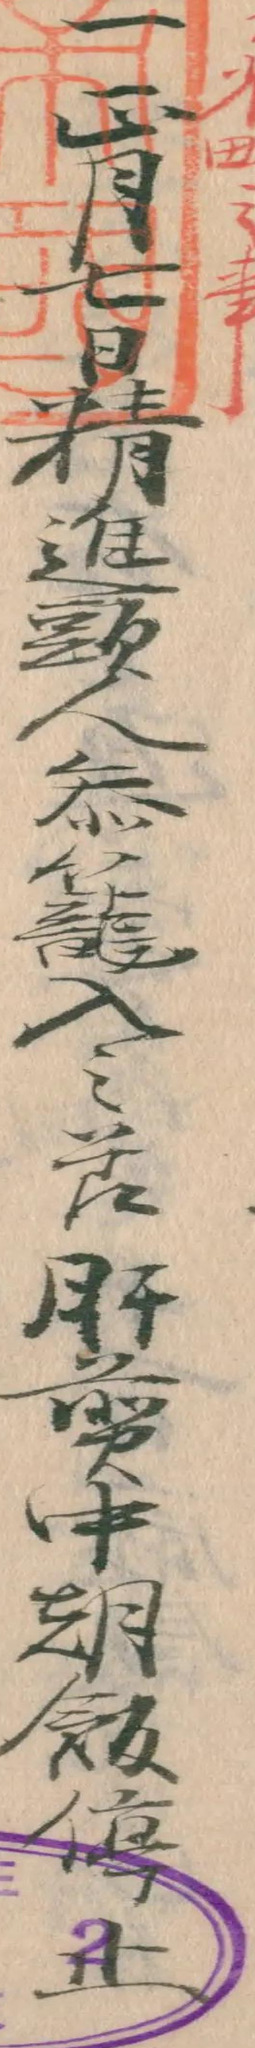一正月七日精進頭人参籠入之節肝煎中朝飯停止
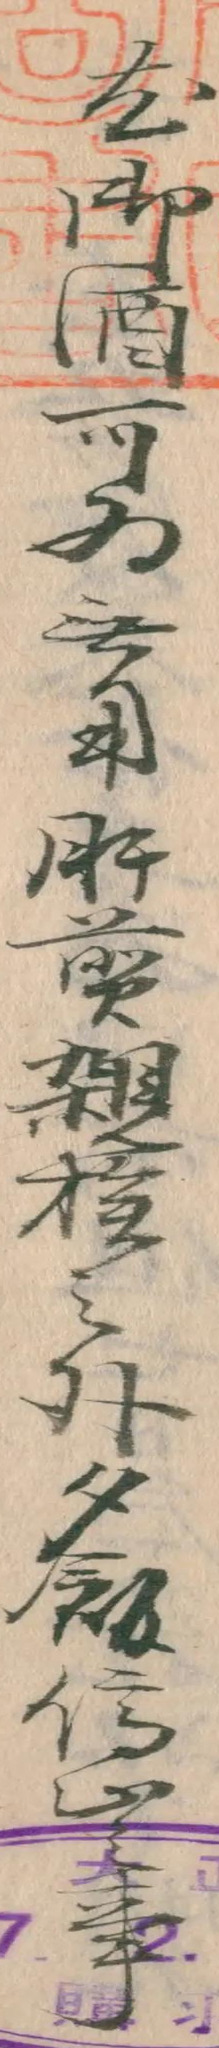尤御酒可為無用肝煎親族之外夕飯停止事
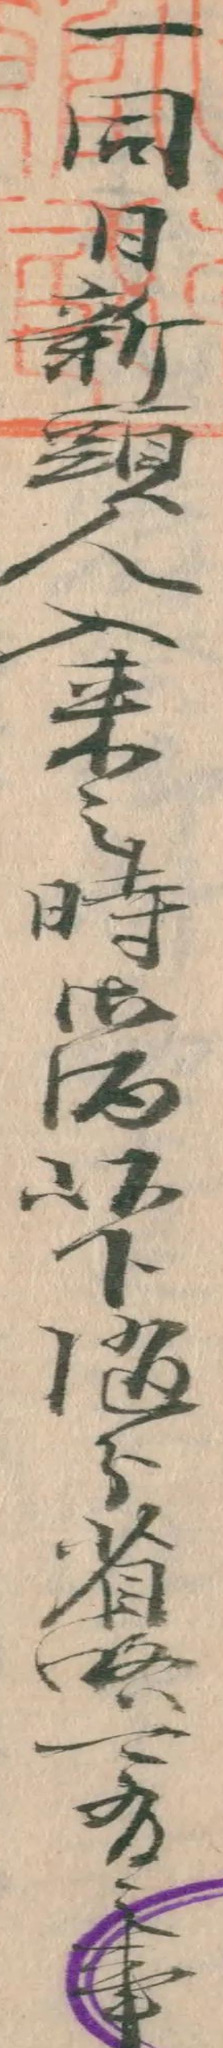一同日新頭人入来之時御酒以下随分省略可有之
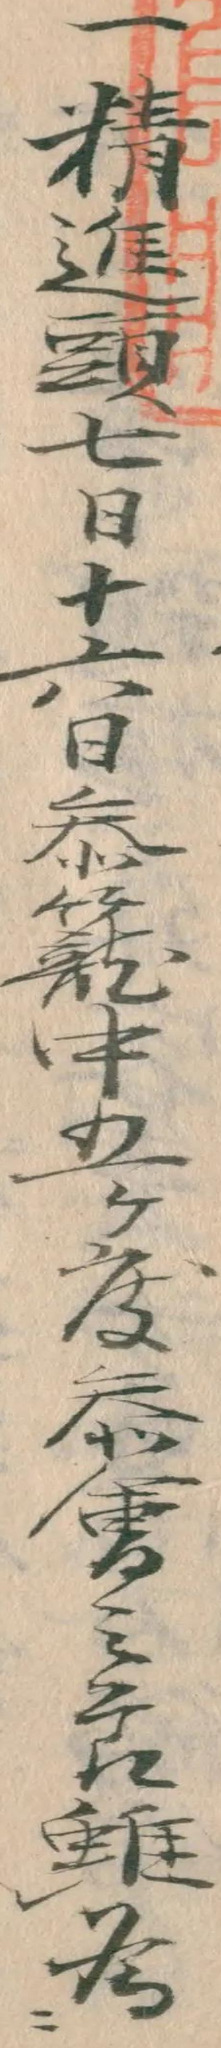一精進頭七日十六日参籠中五ヶ度参會之節雖為
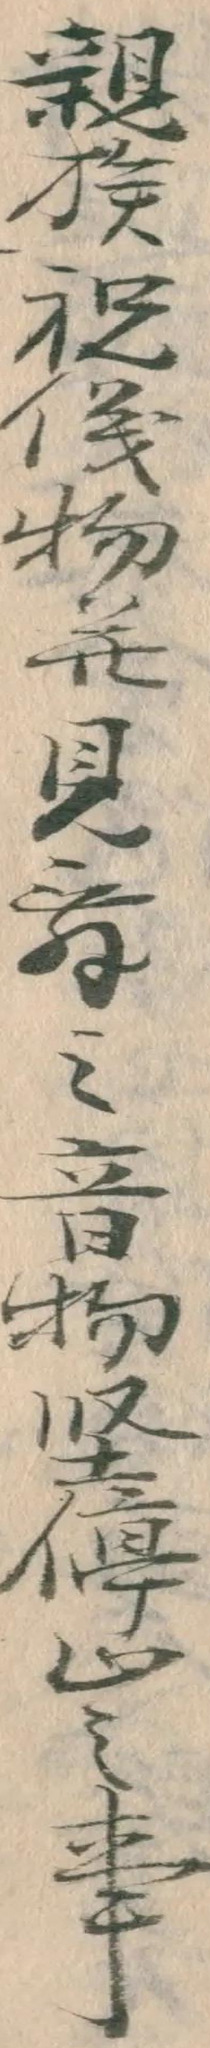親族祝儀物并見舞之音物堅停止之事
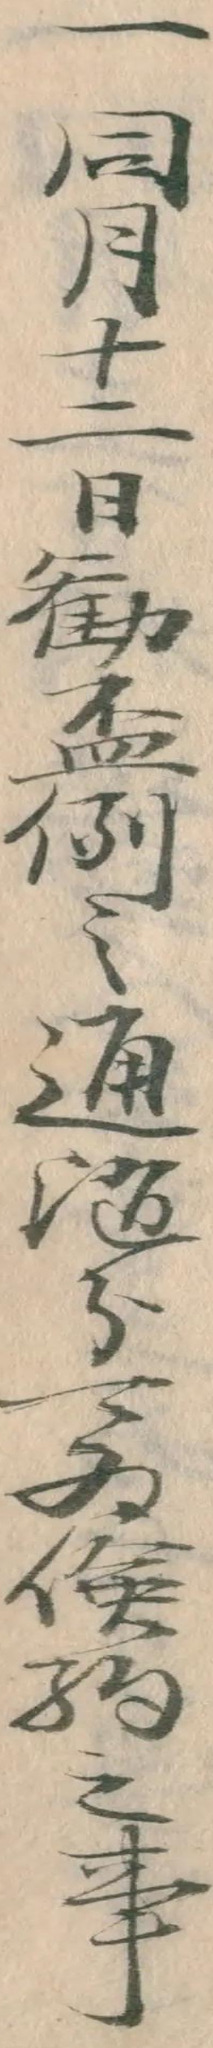一同月十二日勧盃例之通随分可為倹約之事
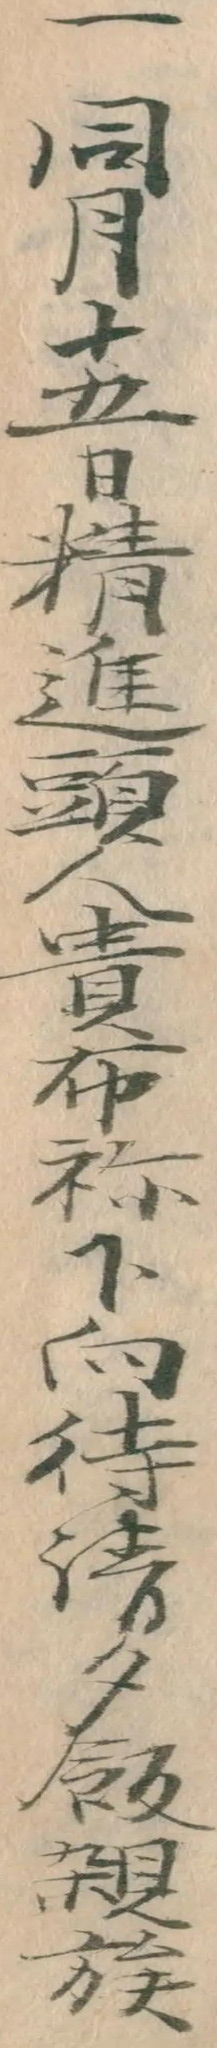一同月十五日精進頭人貴布称下向待請夕飯親族

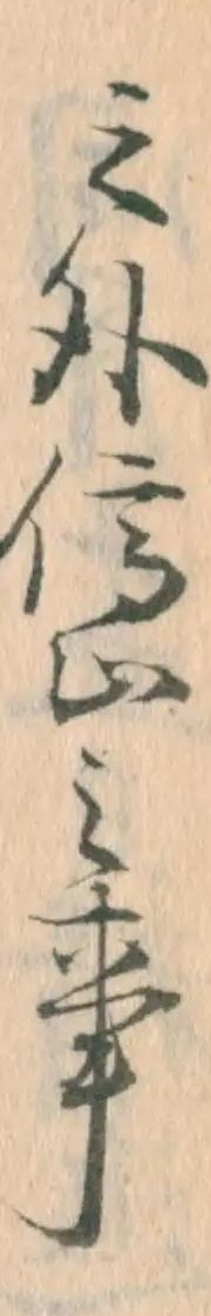之外停止之事
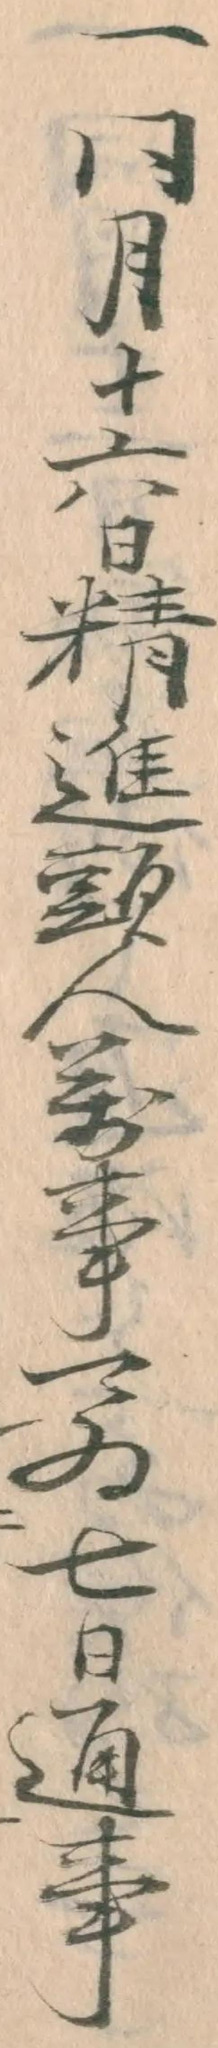一同月十六日精進頭人萬事可為七日通事
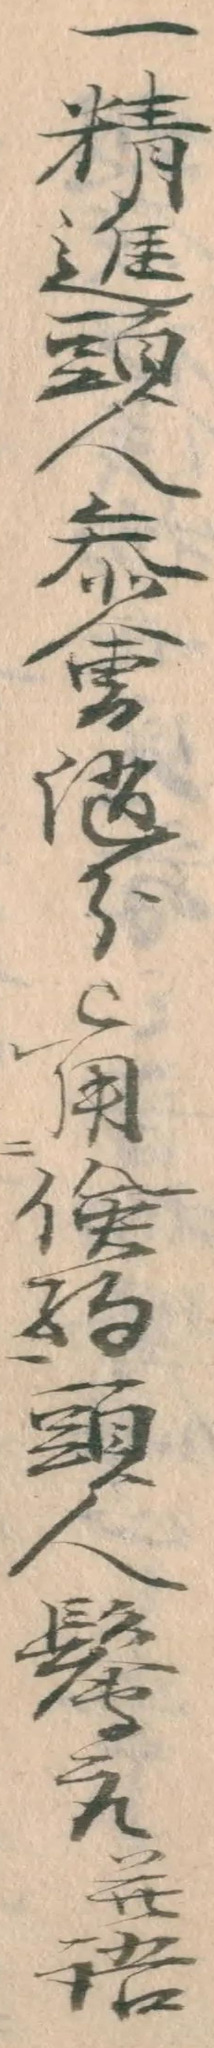一精進頭人参會随分被用倹約頭人髪取并語
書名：賀茂社記録. 第72冊
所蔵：国立国会図書館 National Diet Library, JAPAN
